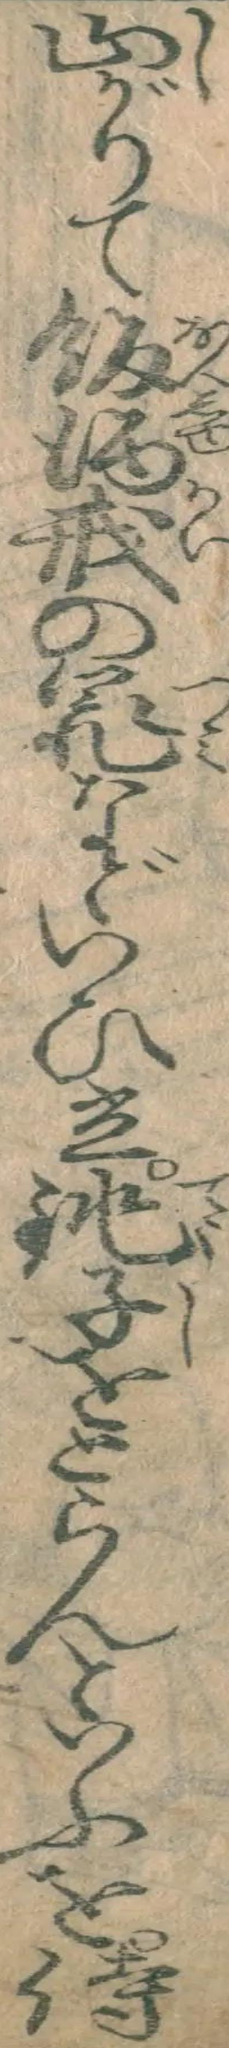止がりて飯酒戒の罪などいひ立。銚子をとらんといふを。侍
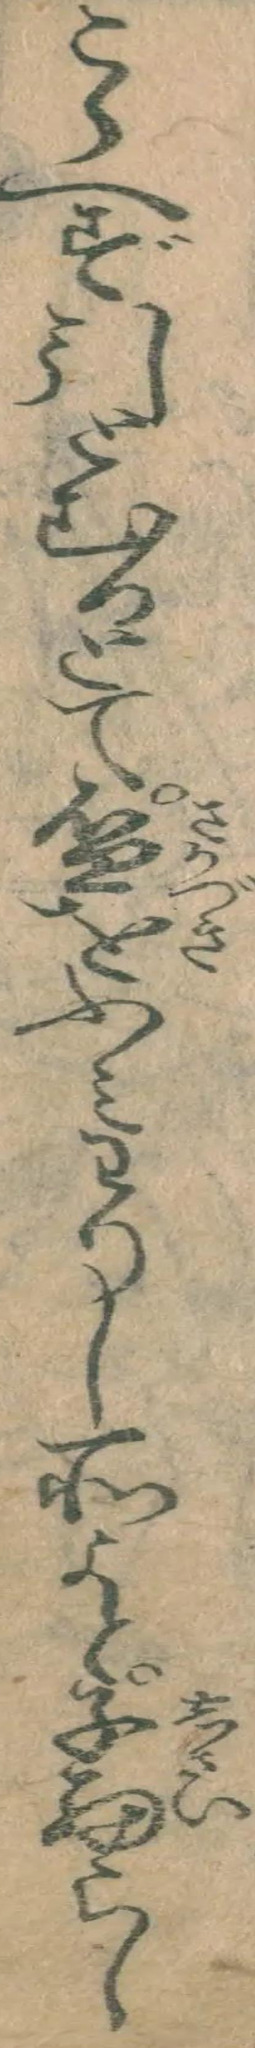こらへず引とむるとて。杯をふみわりし所よと。子細らし

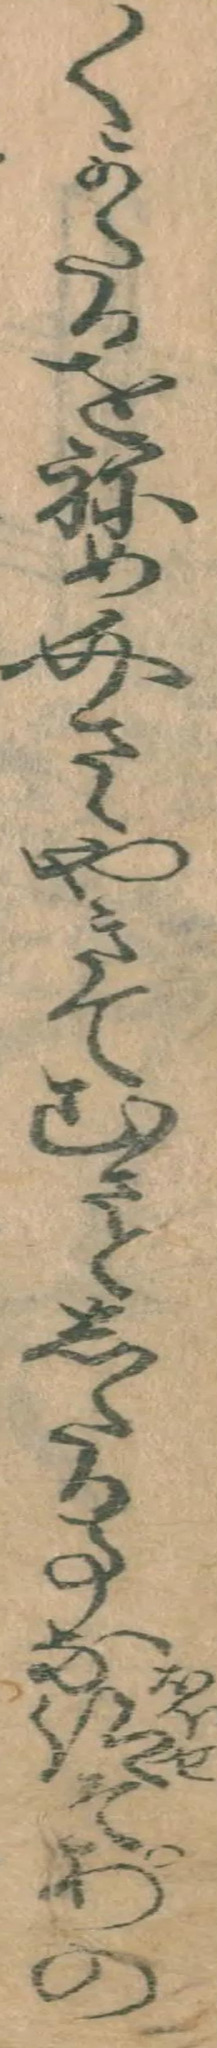くかたるをねめ介さゝやきてむさとしたる事な仰て。あの
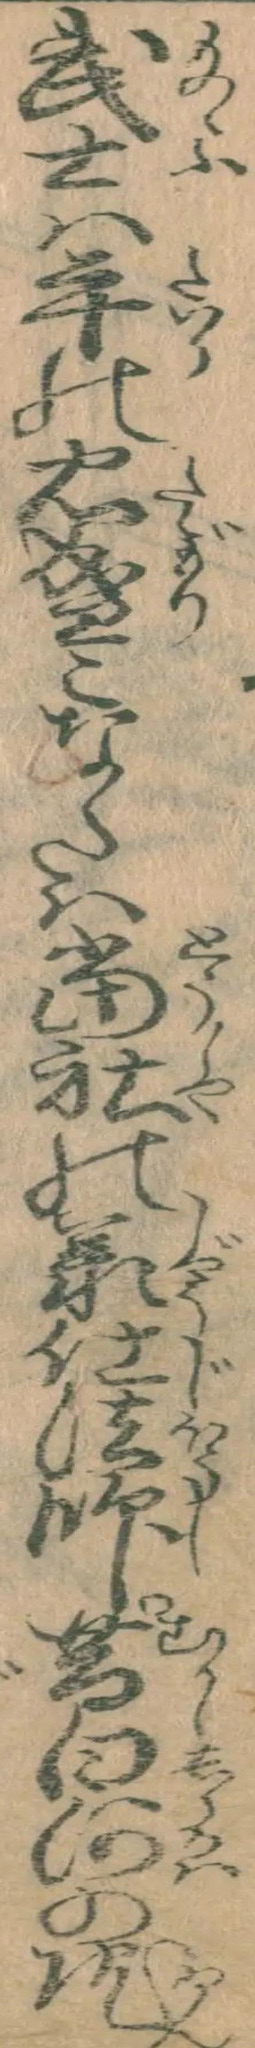武士は平の忠盛こなたは当社の承仕法師。昔白河の院
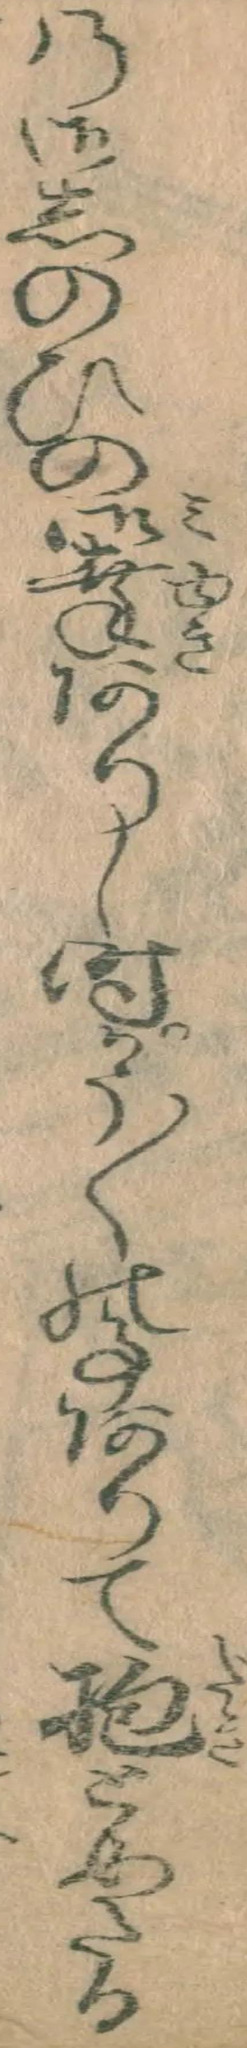の御しのひの御幸ありし時。かう〳〵の事ありて抱とめたる
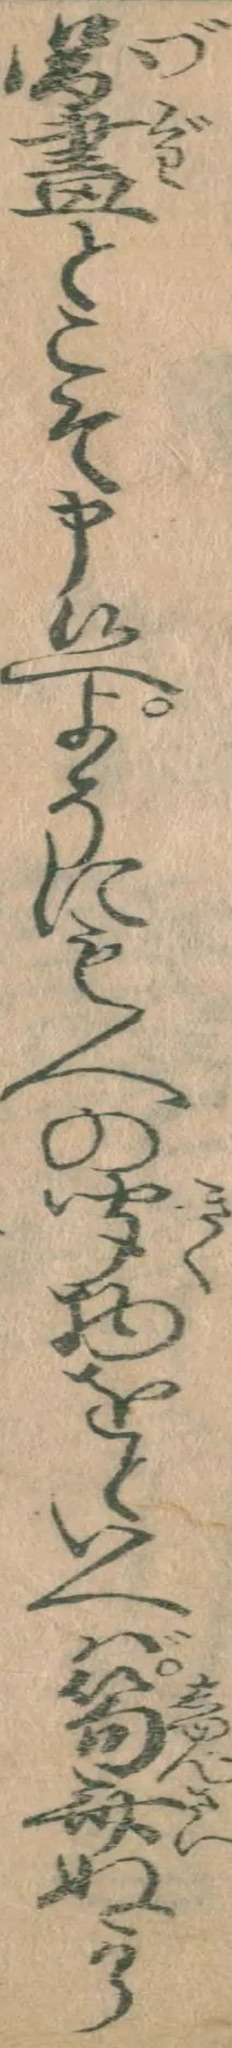図画とこそ申候へ。ようにも人の聞物をといへば。筍斎ぬから
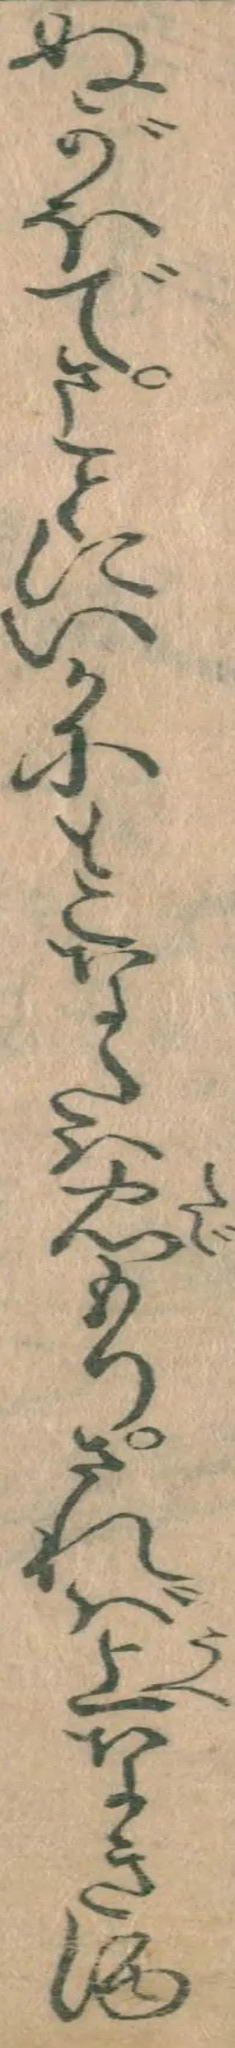ぬがほで。まことにいかにもこなたは忠もり。されば上なき酒
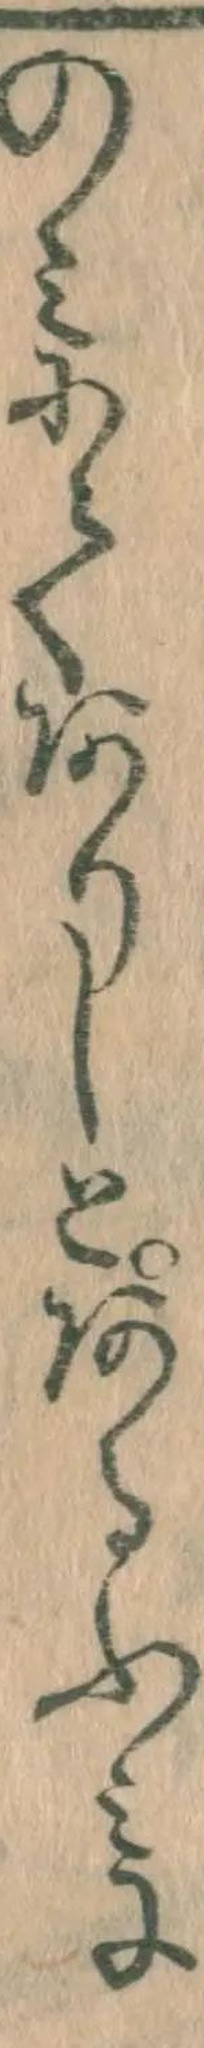のみにてありしと。あるふみに
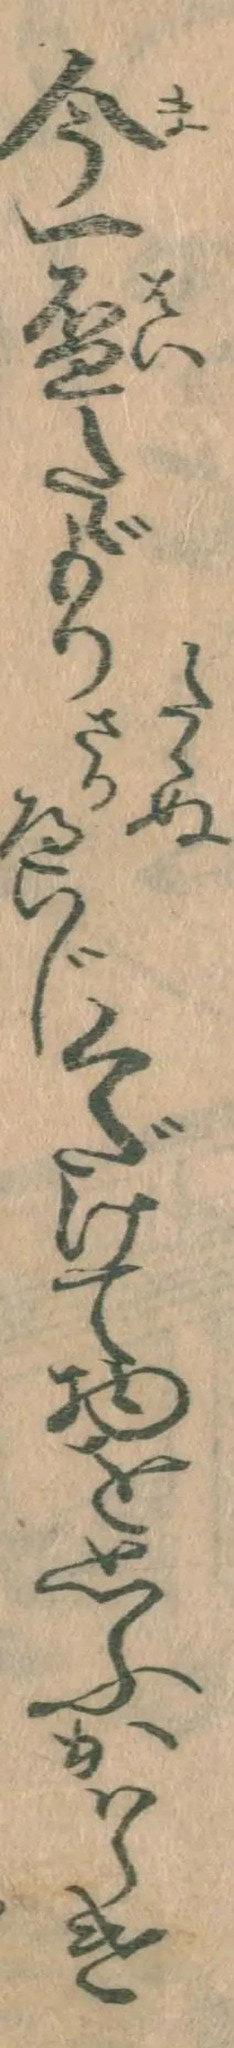今一杯たゞもりたらぬさるへいじくだけて物を思ふかはらけ
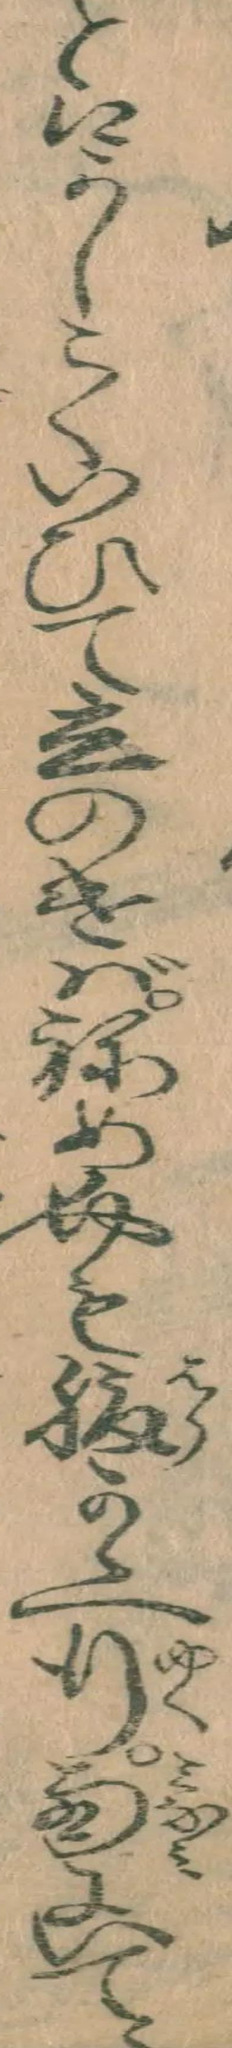と口かしこくいひて立のけば。ねめ介も腹かゝへ行。南にいてゝ
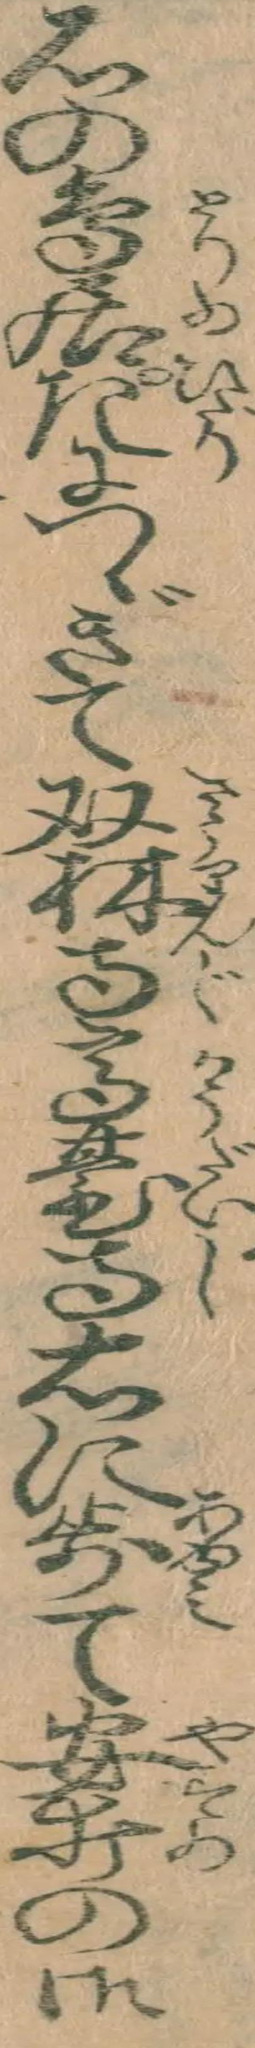石の鳥居。左につゞきて双林寺高台寺右に歩て安井の御
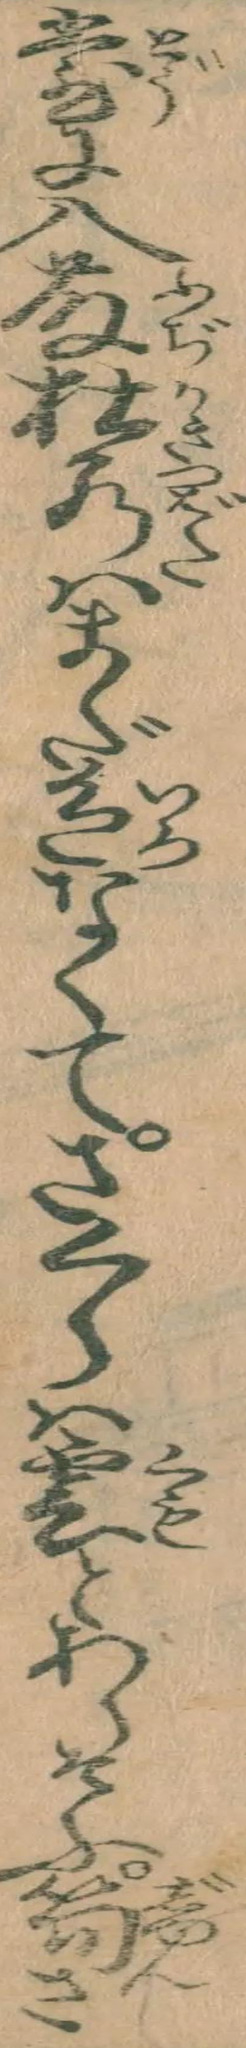堂に入藤杜若はまだ色なくて。さくらは雲とあらそふ。筍さ
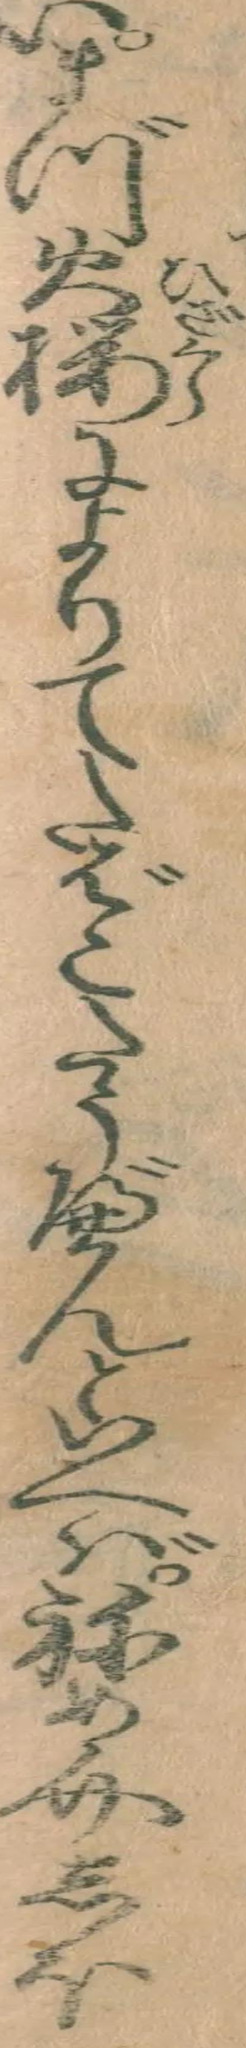い。まづ火桜によりてたばこたうべんといへば。ねめ介しほ
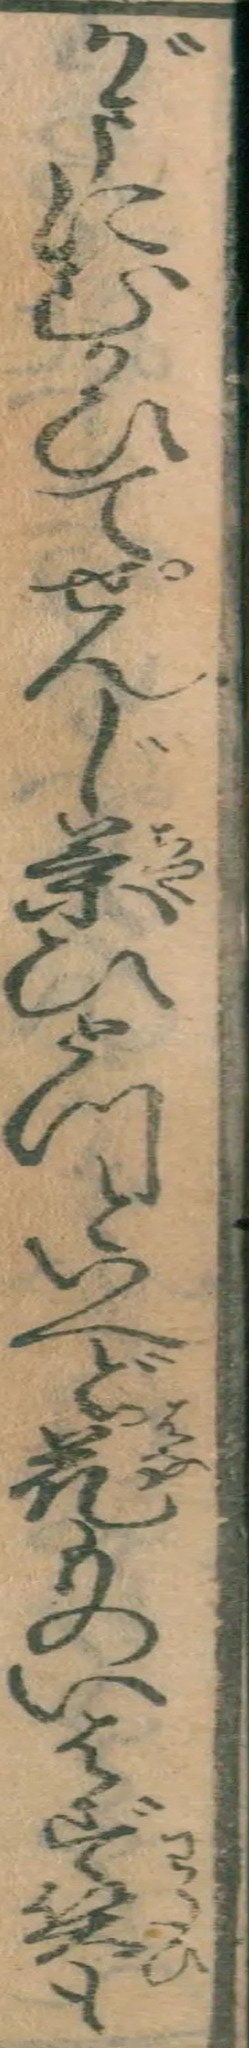がまにむかひて。せんじ茶ひとつといへど花ものいはず笑も
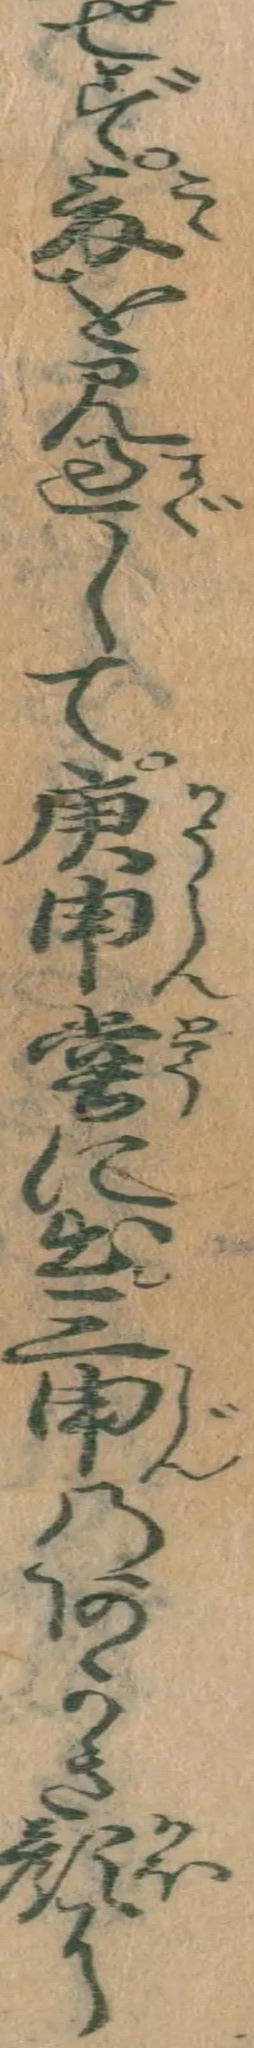せず。爰を見過して。庚申堂に出。三申のあかき顔に
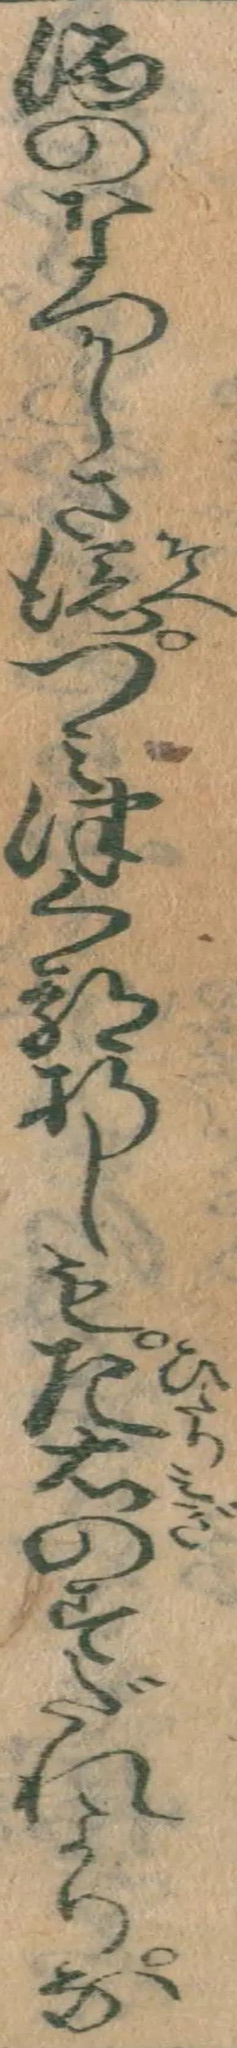酒のなつかしさ添。つみつくる折しも。左右のすだれより。な
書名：新竹斎 5巻
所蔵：国立国会図書館 National Diet Library, JAPAN
